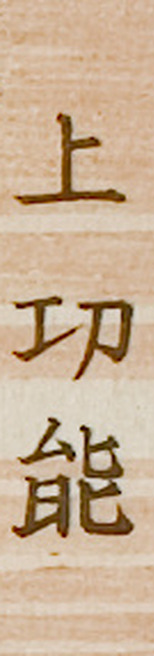上功能
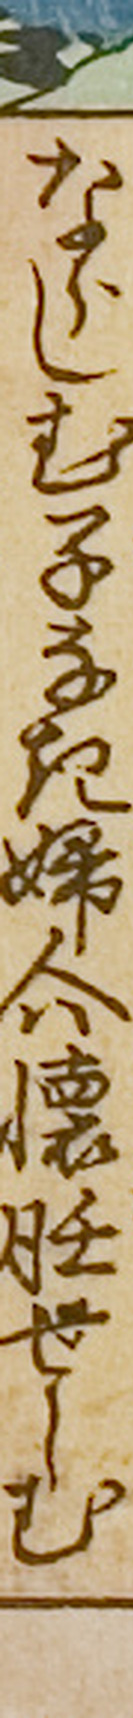ならしむ子なき婦人ハ懐妊せしむ
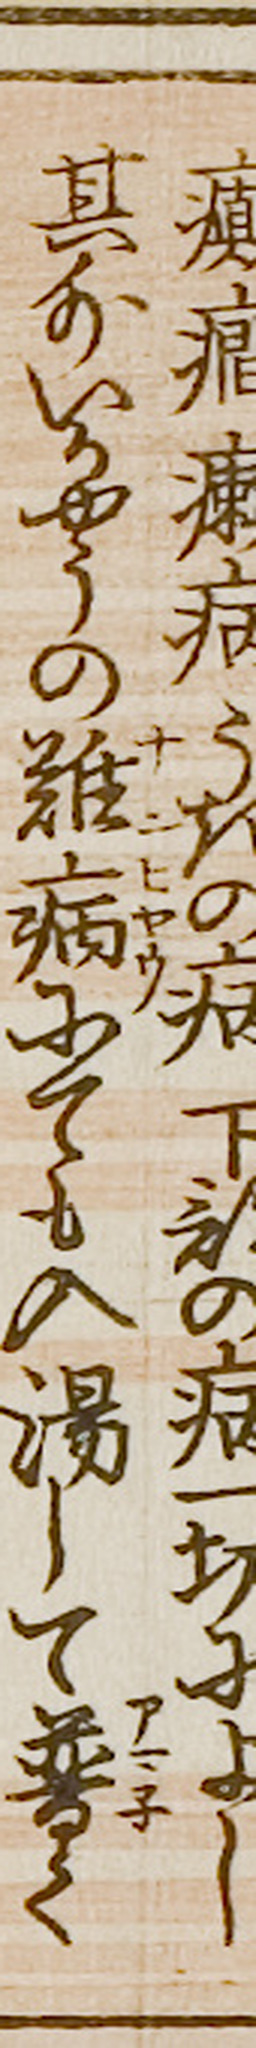其外いかやうの難病にても入湯して普く
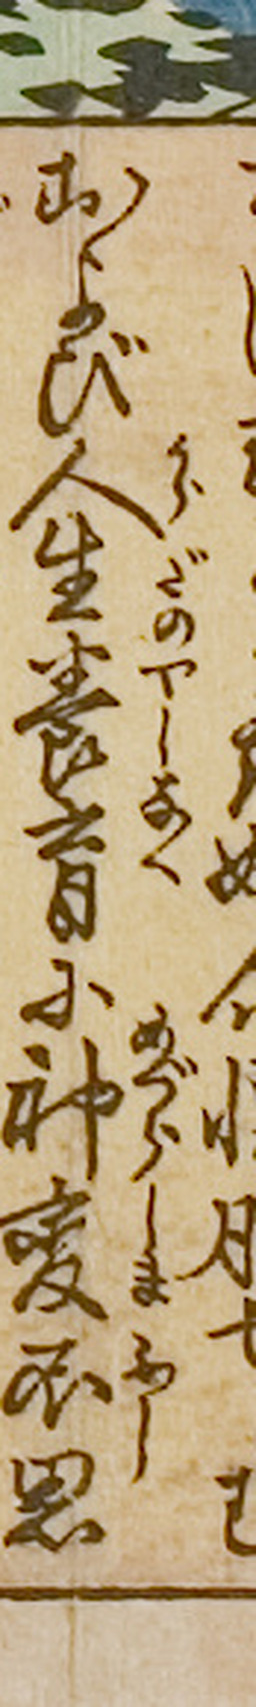および人生養育に神変不思
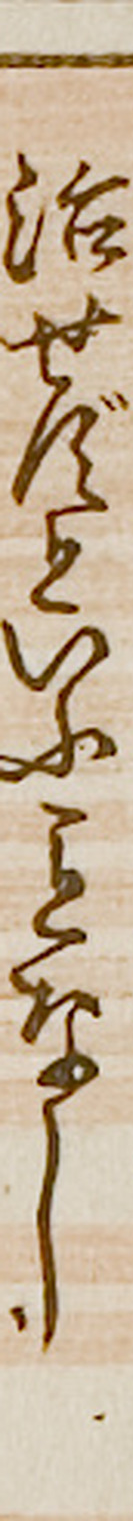治せずといふことなし
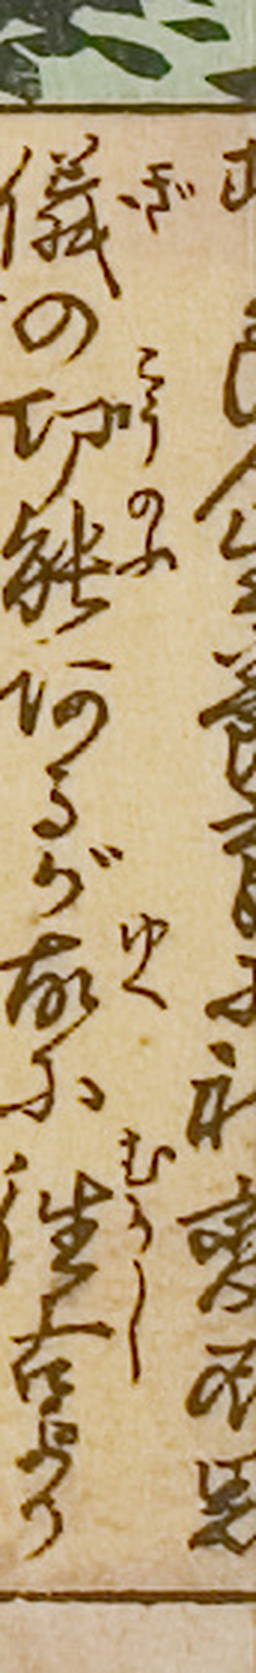議の功能あるが故に往古より
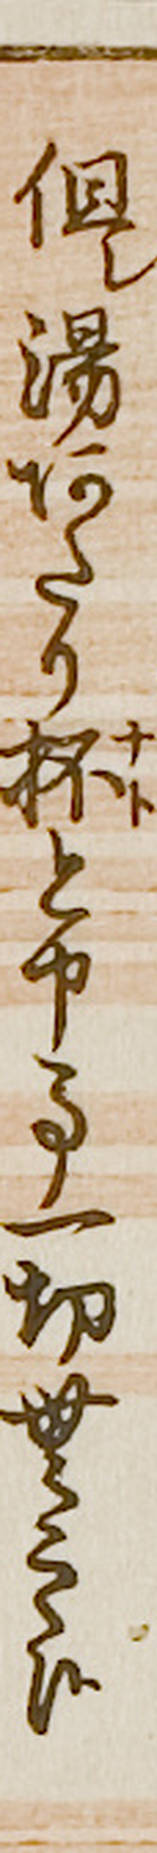但し湯あたり等と申事一切無之候
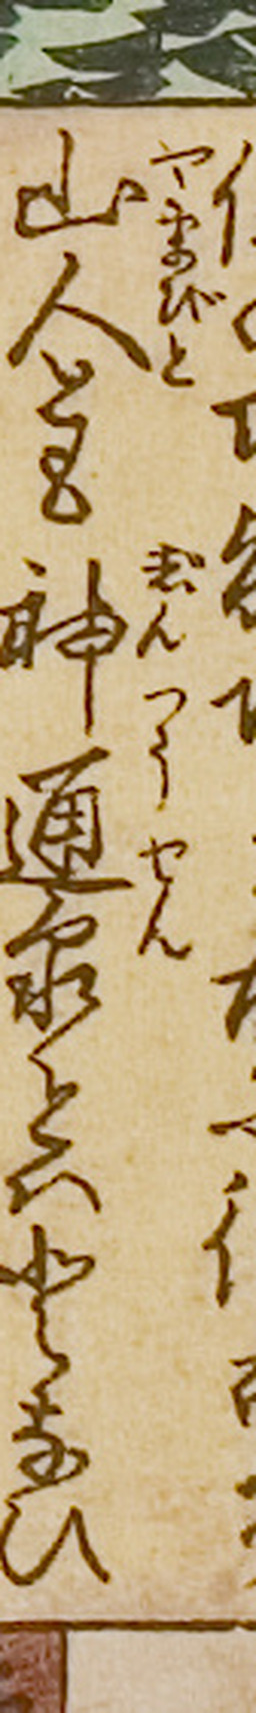山人とも神通泉とハとなひ
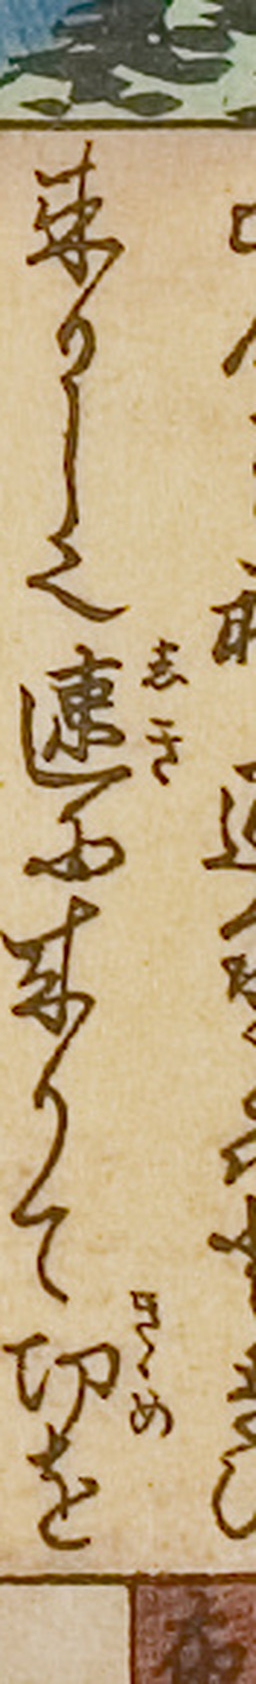来りし也速に来りて功を
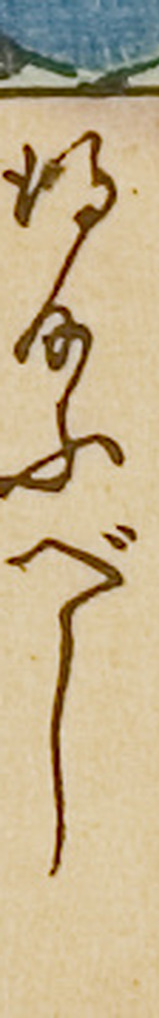得るふべし
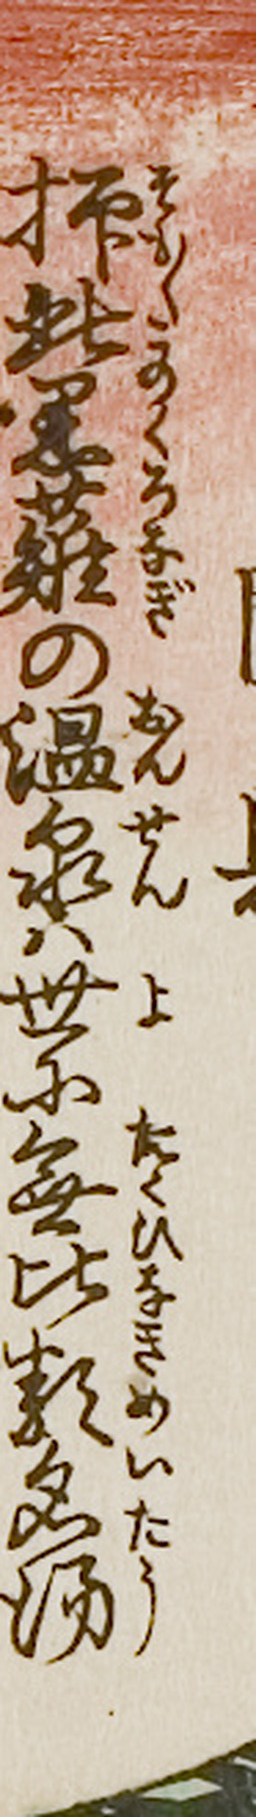抑此黒薙の温泉ハ世に無比類名湯
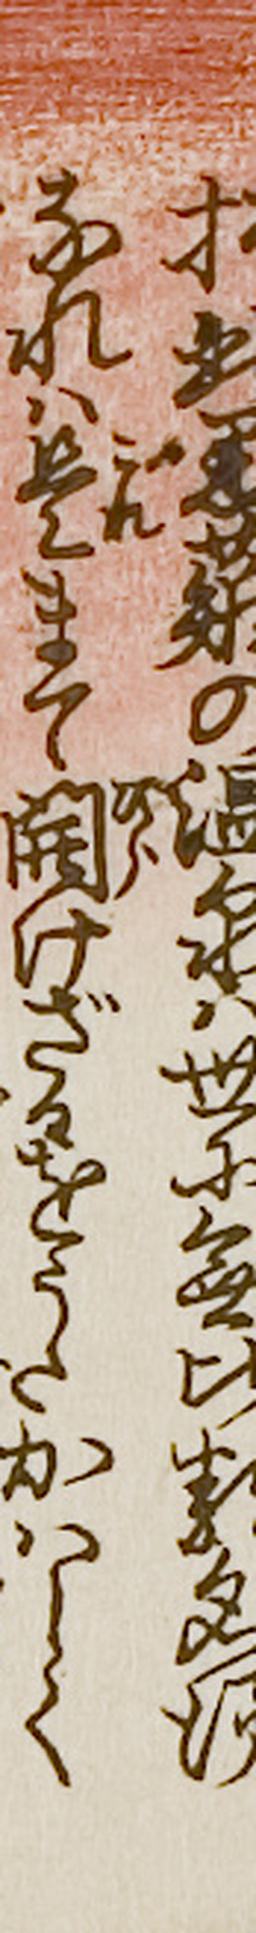なれハ是まて開けざるをうたかハしく
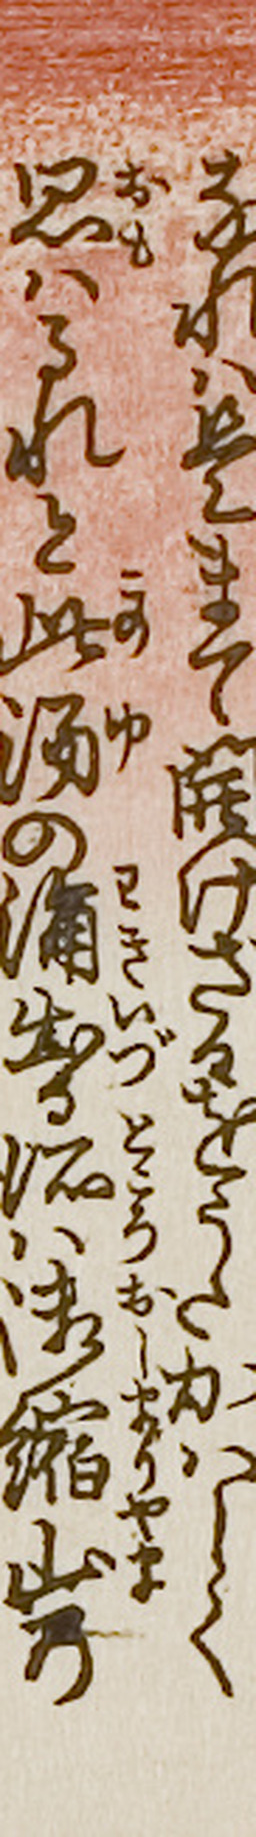思ハるれと此湯の涌出る所ハ御縮山の
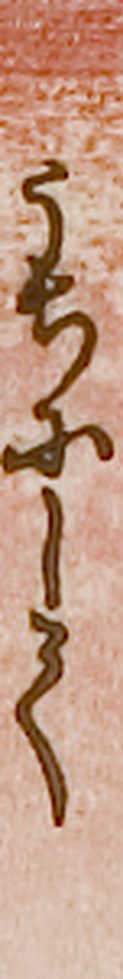うちにして
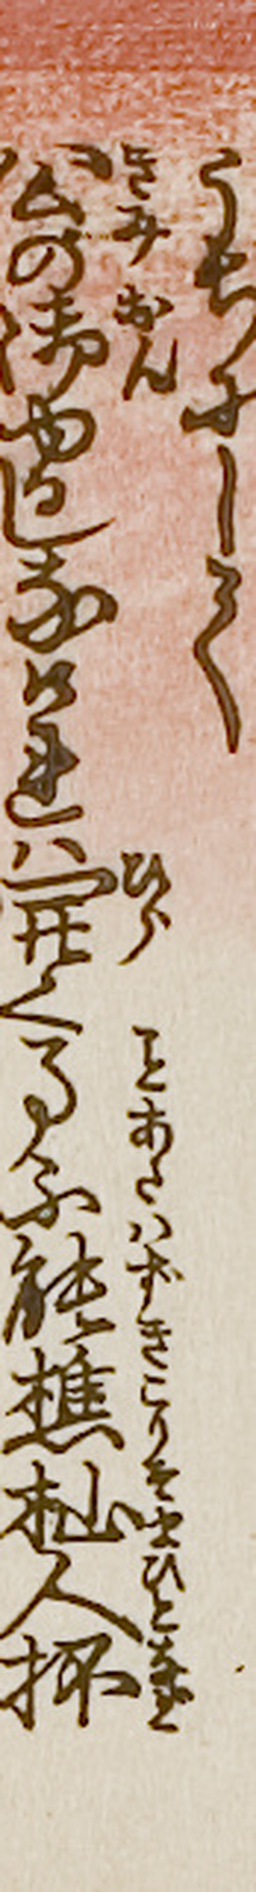公の御ゆるしなけれハ開く事不能樵杣人抔
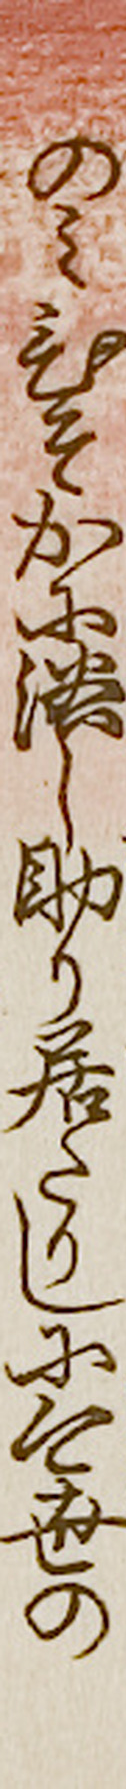のミひそかに浴し助り居たりしに今世の
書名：[越中国新川郡黒薙温泉引札]
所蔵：東京大学総合図書館 General Library in the University of Tokyo, JAPAN
